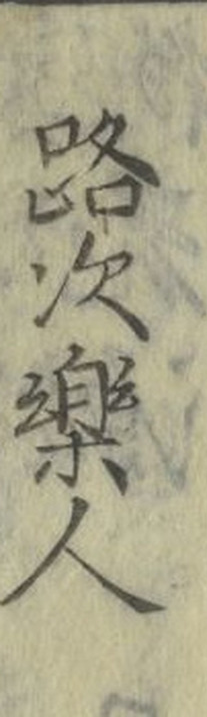路次樂人
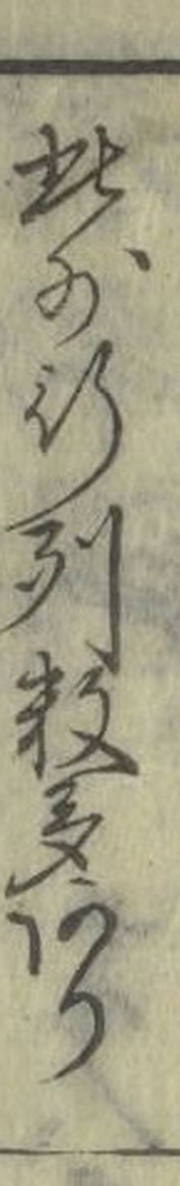此外行列数多あり
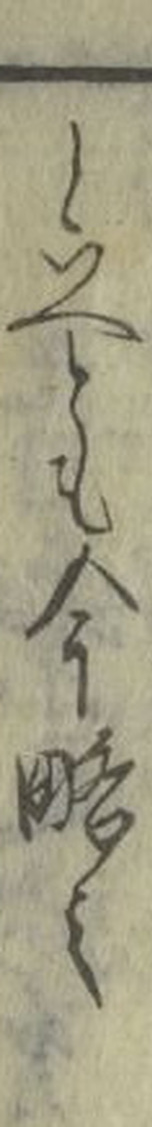といへとも今略之

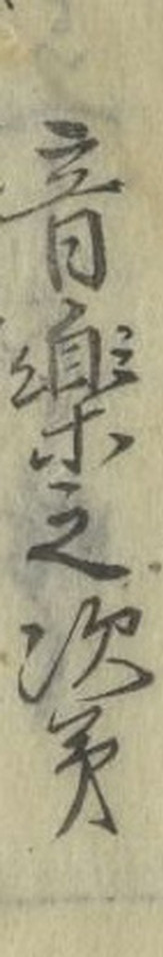音樂之次第
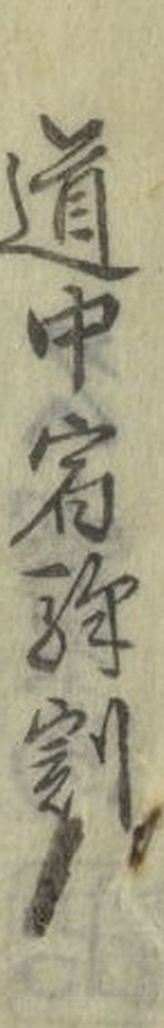道中宿驛割
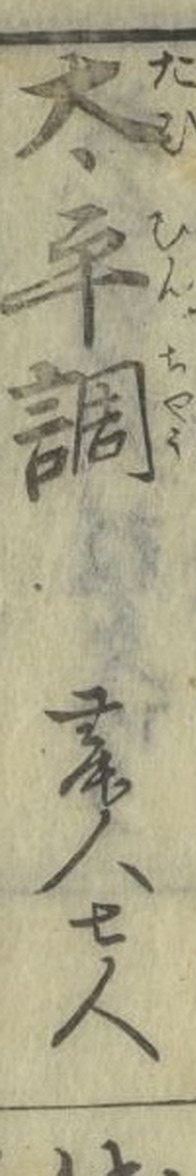大平調舞人七人
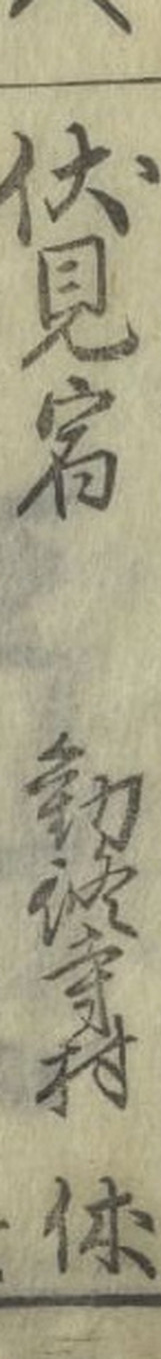伏見宿勧修寺村休
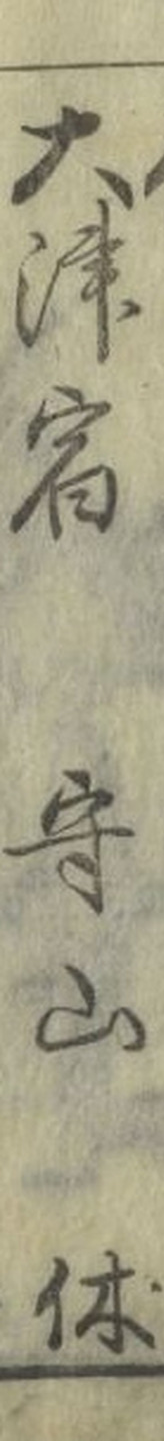大津宿守山休
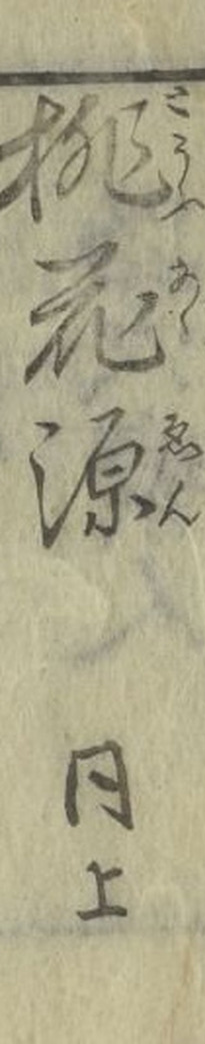桃花源同上
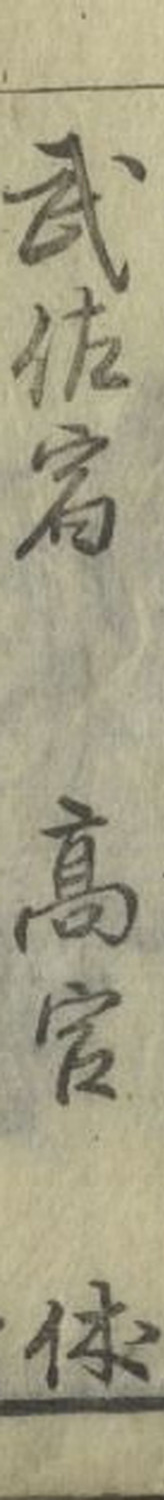武佐宿高宮休
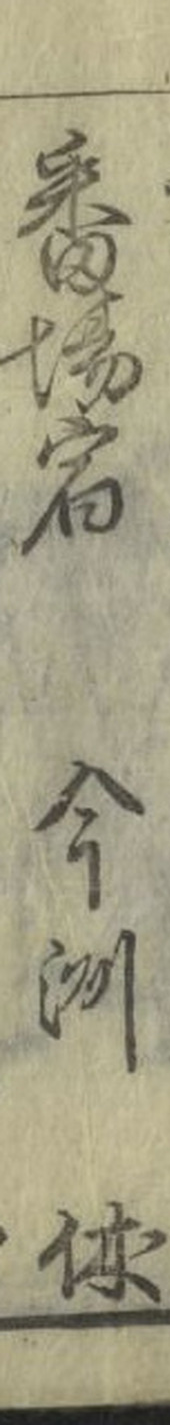番場宿今洲休
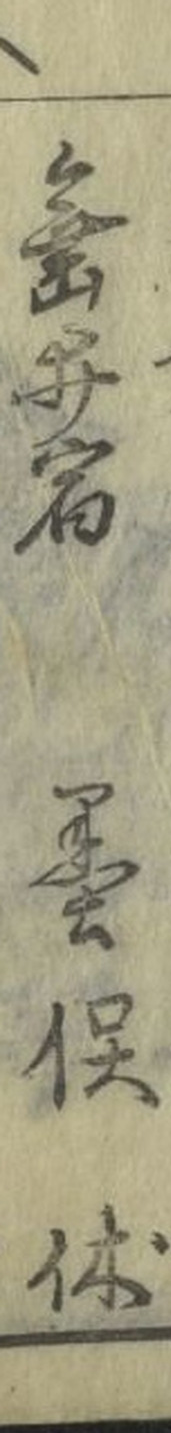垂井宿墨俣休
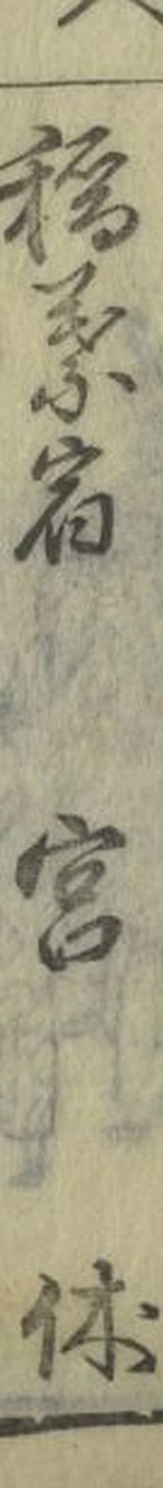稲葉宿宮休
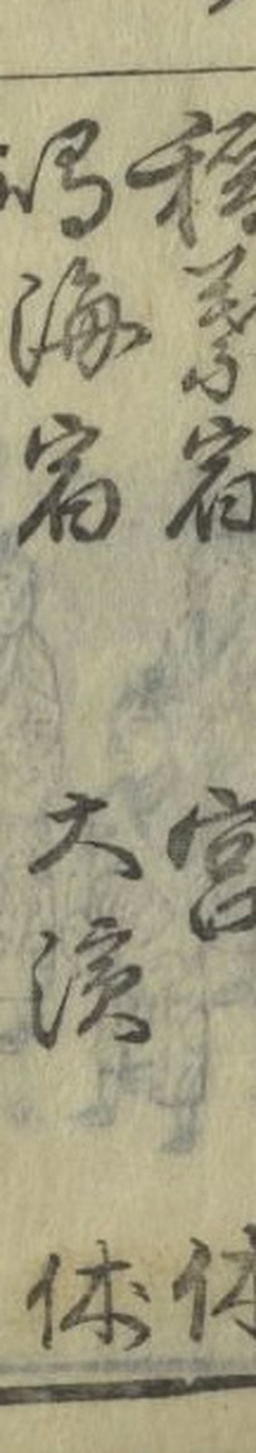鳴海宿大濱休
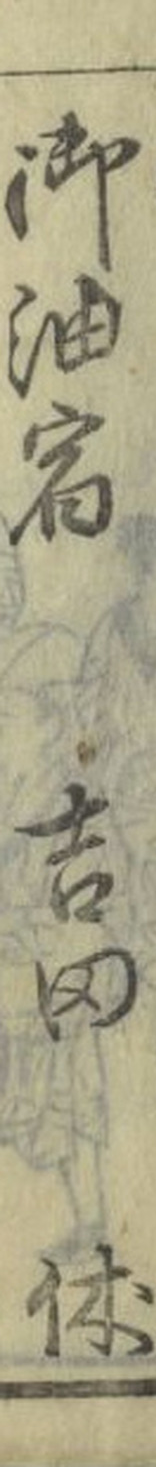御油宿吉田休
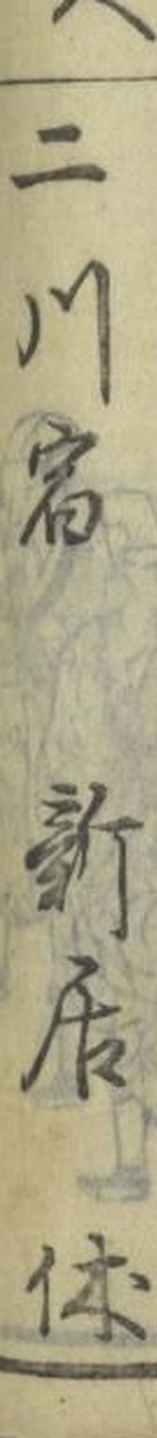二川宿新居休
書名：琉球人行列記
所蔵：University of the Ryukyus Library
